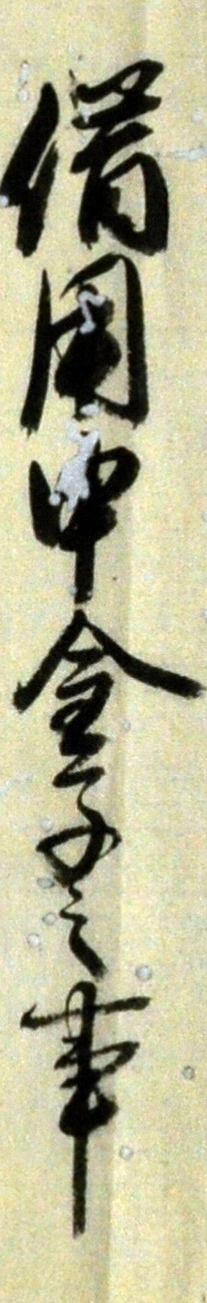借用申金子之事
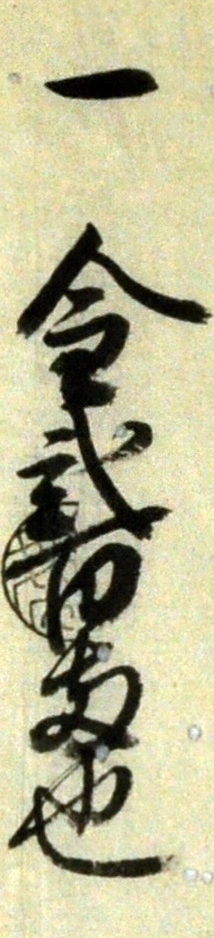一金弐百両也
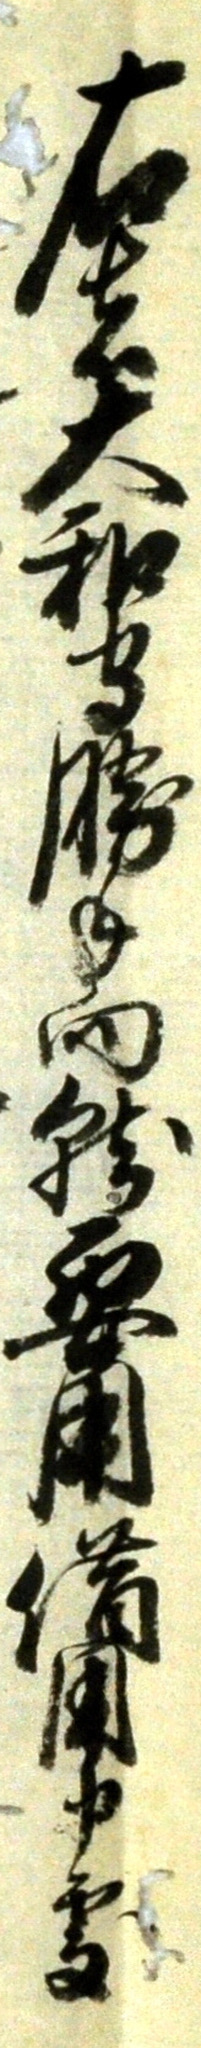右者大和守勝手向就要用借用申処
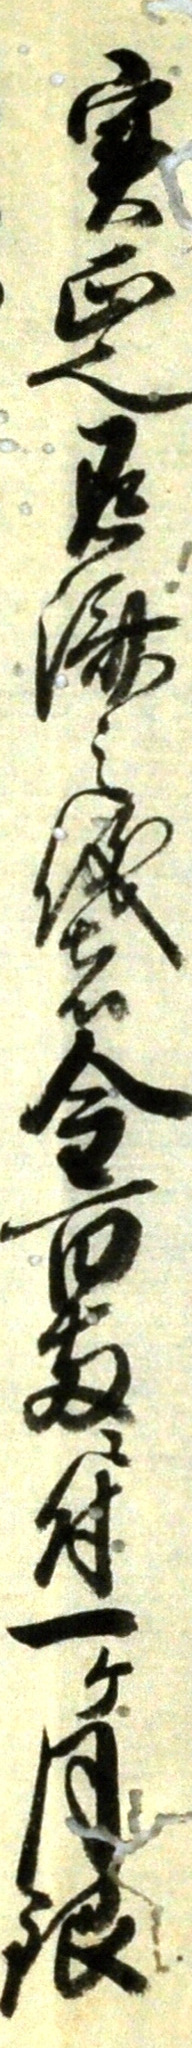実正也返済之儀者金百両ニ付一ヶ月銀
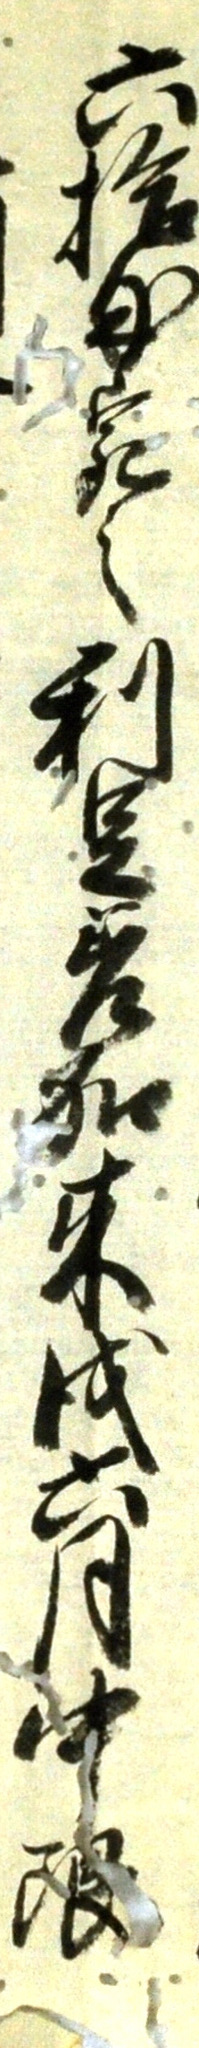六拾匁宛之利足差加来戌六月中限
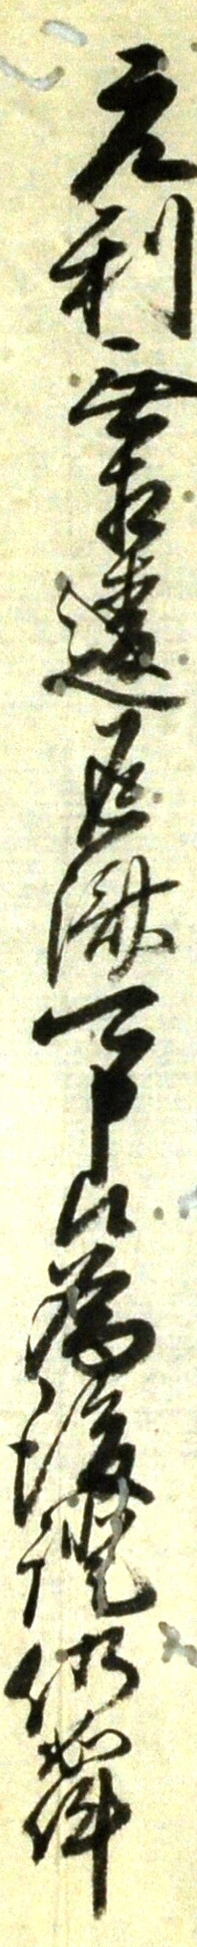元利無相違返済可申候為後証仍如件
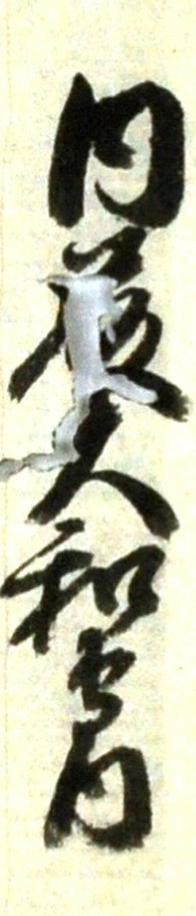内藤大和守内
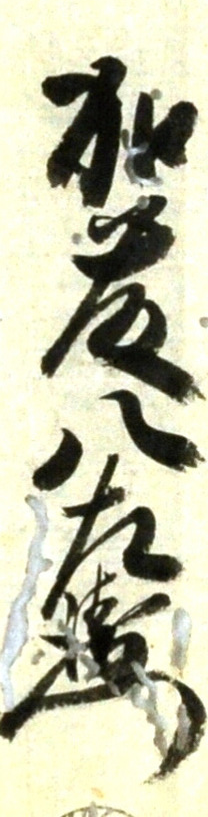加藤八左衛門㊞
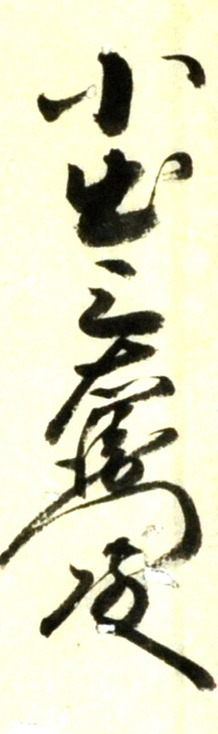小出三右衛門殿
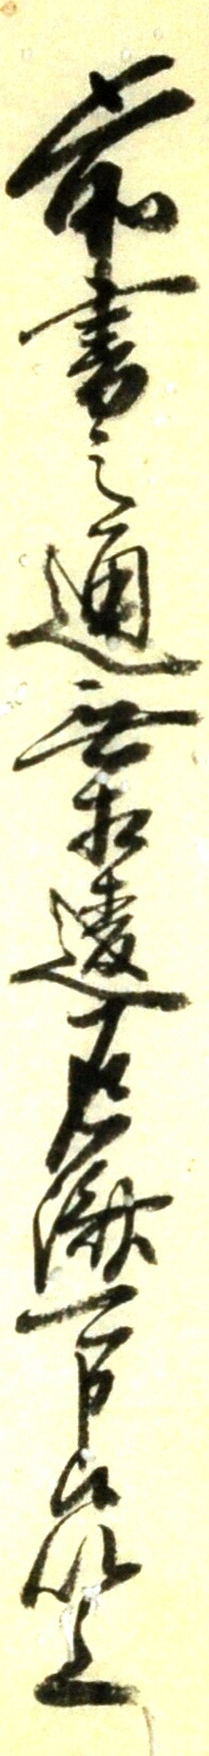前書之通無相違返済可申候以上
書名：借用申金子之事
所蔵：伊那市立高遠町図書館・合同会社AMANE
